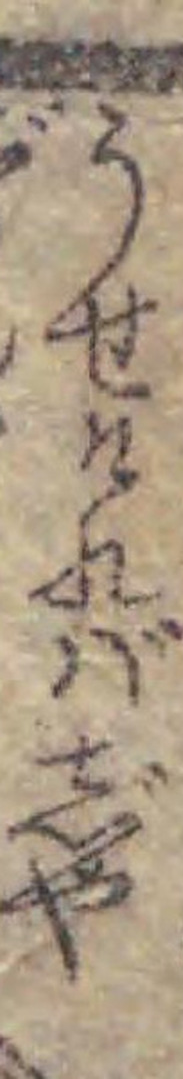うせければじや
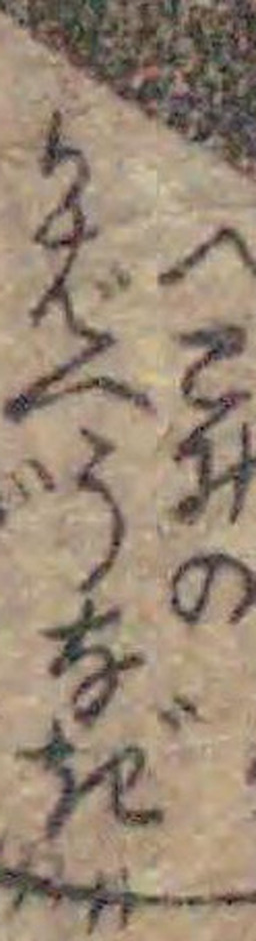かばへうなぎ
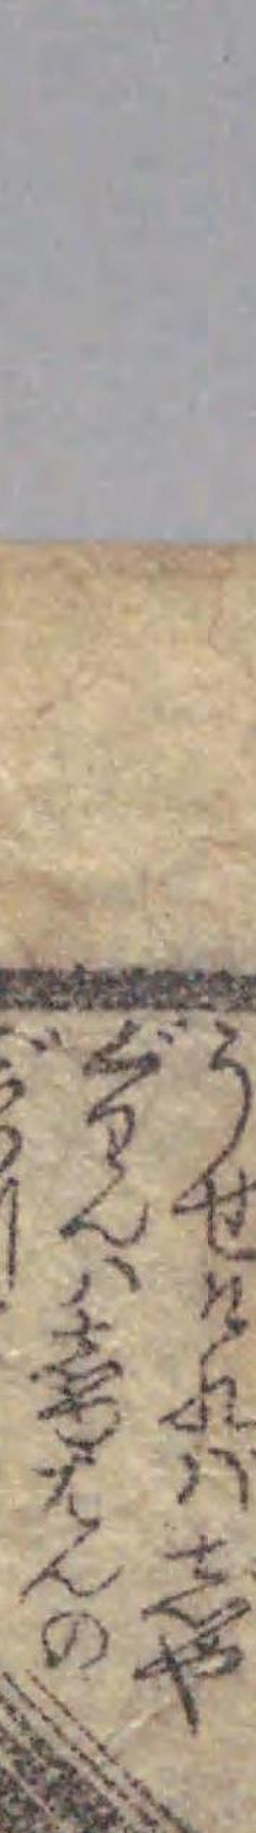ぐわんはしゆはんの
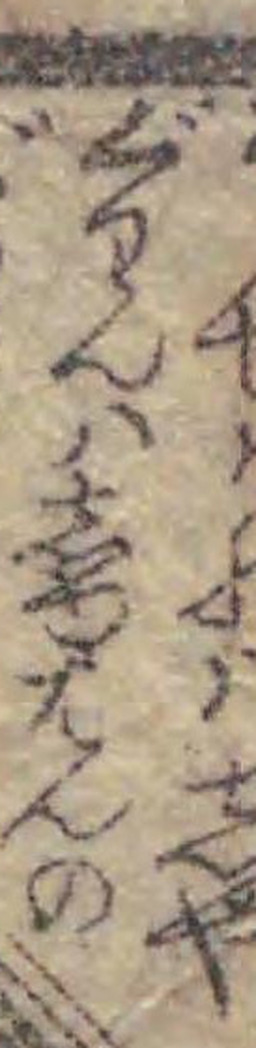ぐわんはしゆはんの
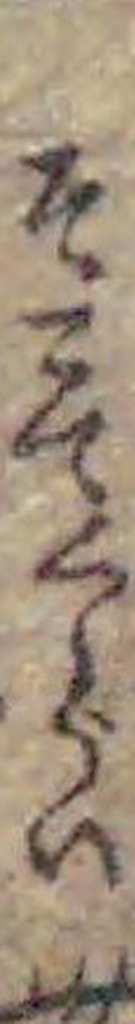そこてくらい
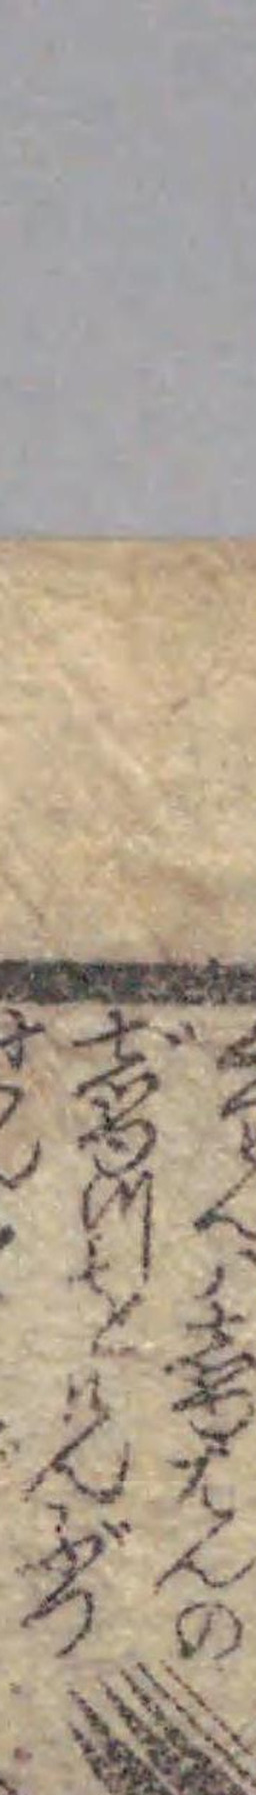じゆつをけんぶつ
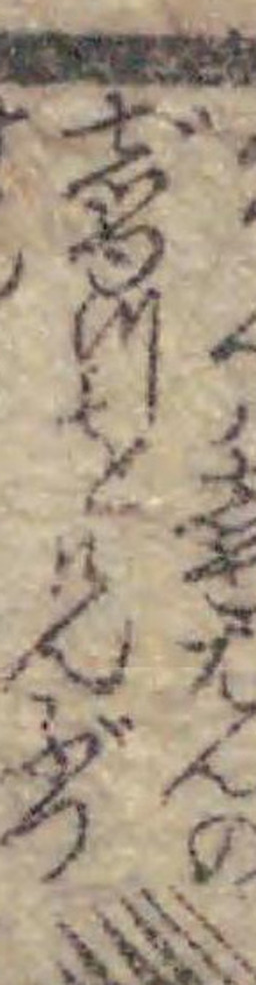じゆつをけんぶつ
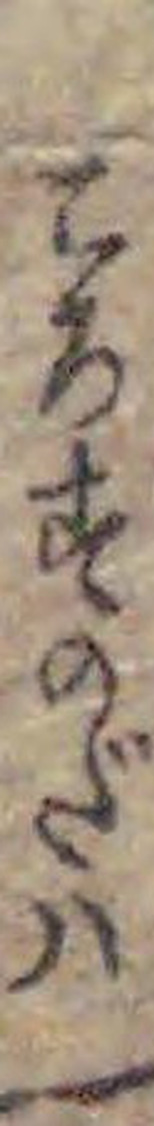ころすのだは
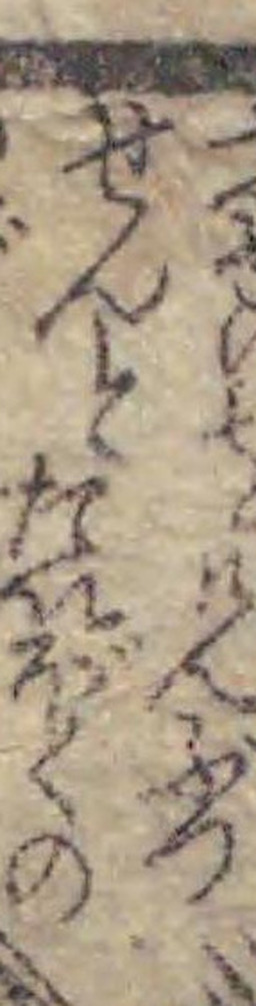せんとたいぼくの
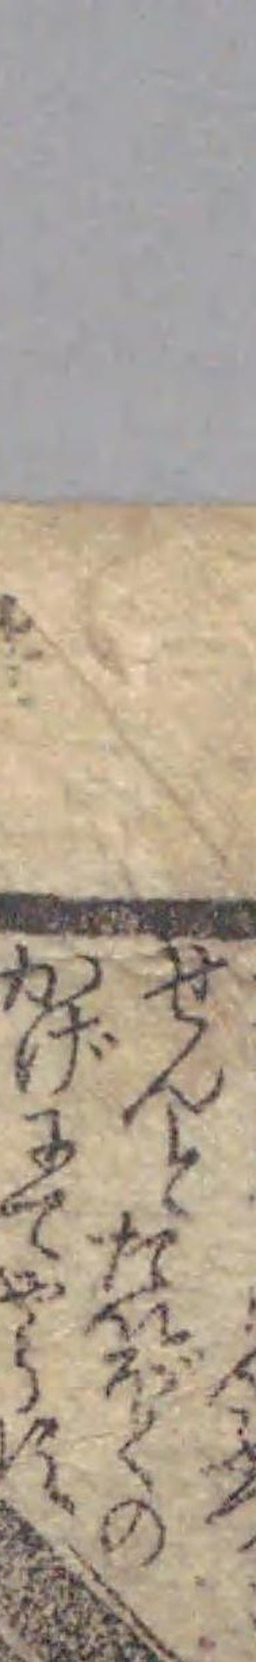かげにてやうす
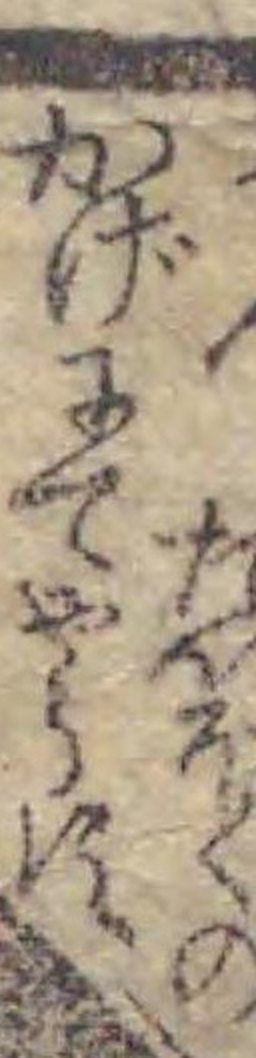かげにてやうす
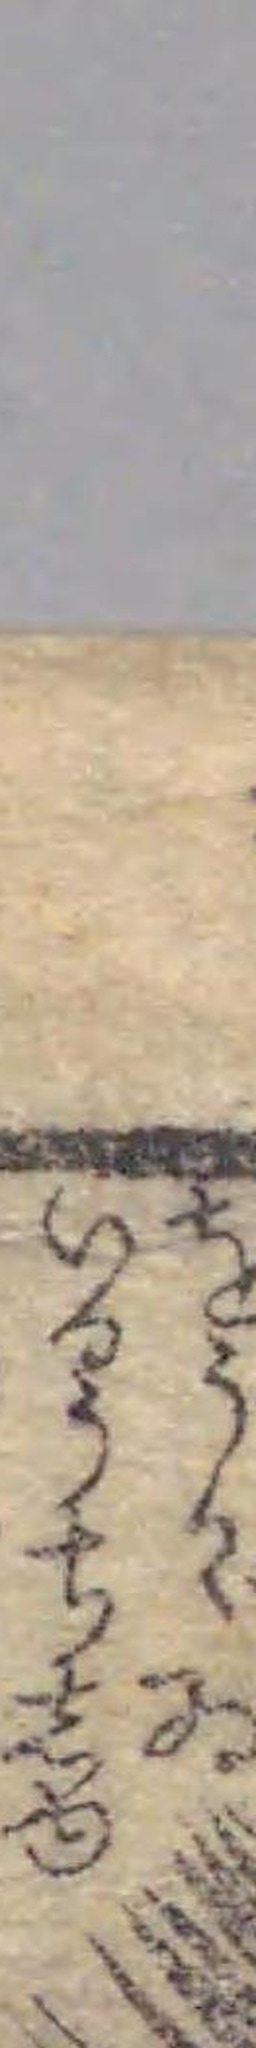いるうちしゆ
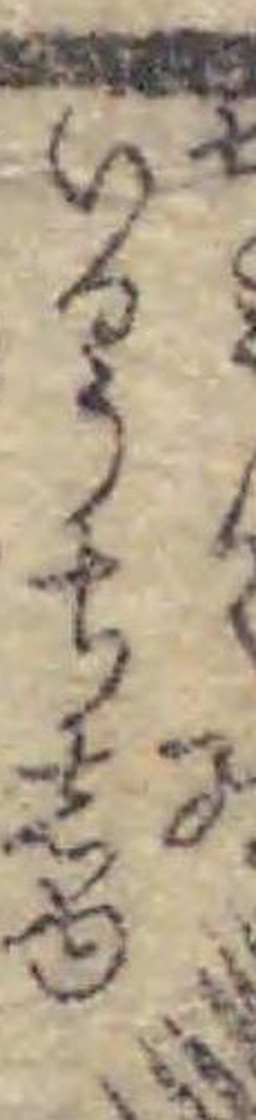いるうちしゆ
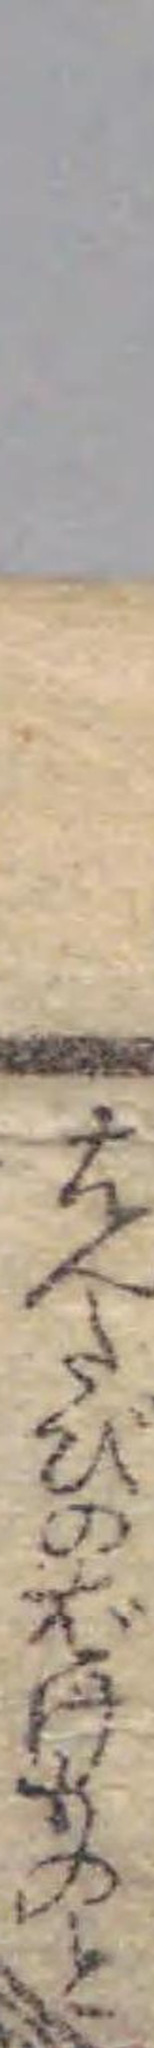はんたびのばけものと
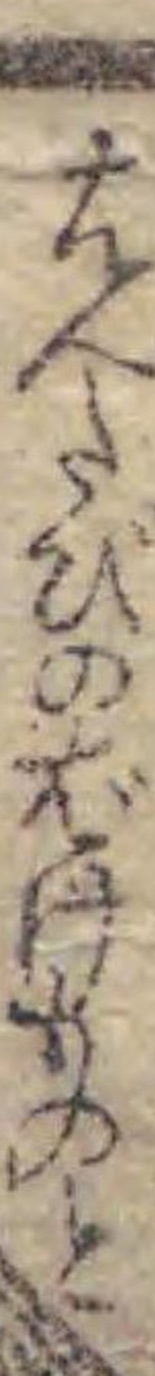はんたびのばけものと
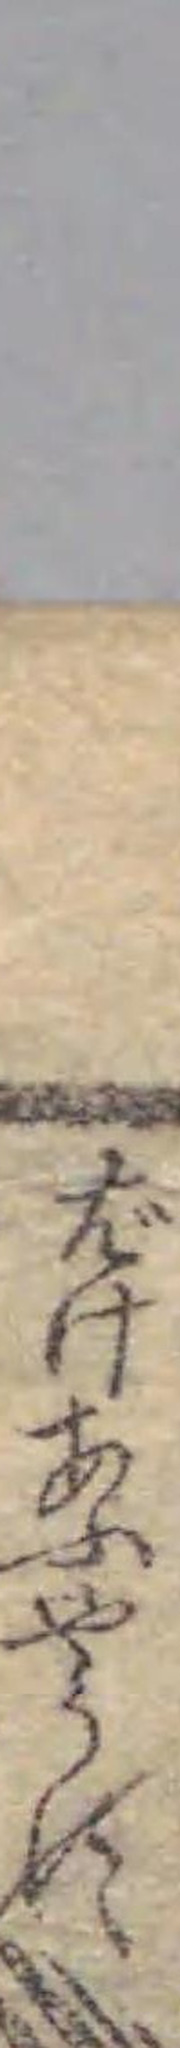ばけあふやうす
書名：化物世界夜半嵐 : 3巻
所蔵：国立国会図書館 National Diet Library, JAPAN
